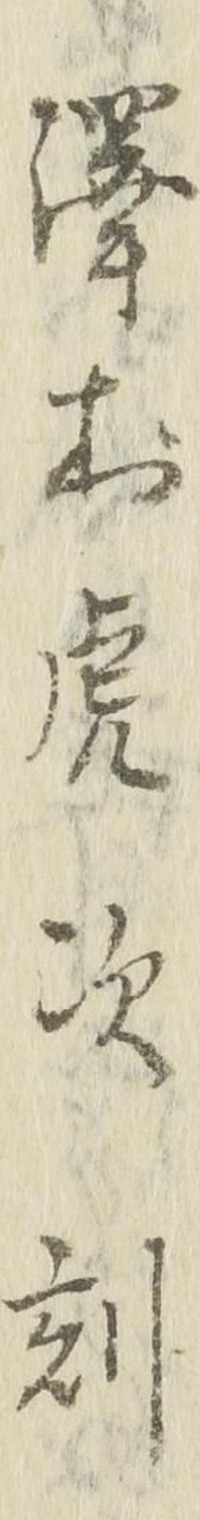澤村虎次刻
